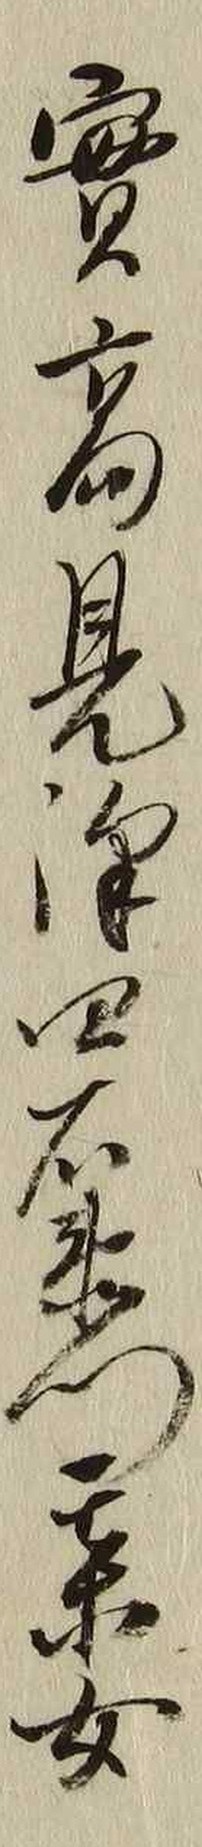実高見沢四右衛門某女
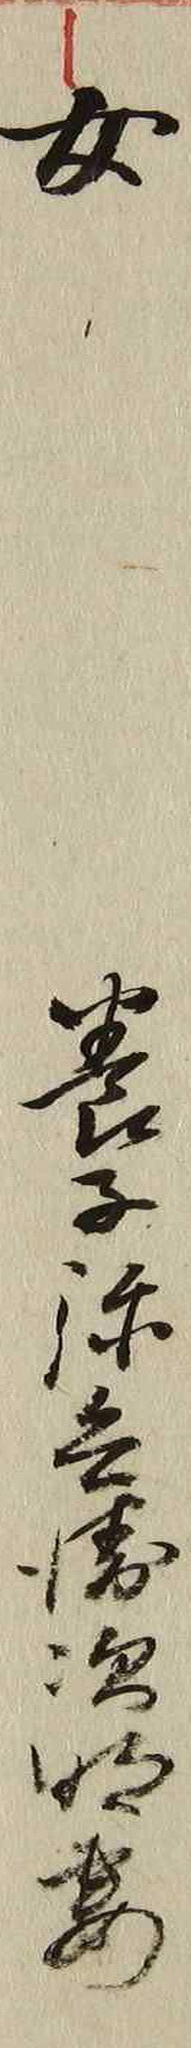女養子弥兵衛次明妻
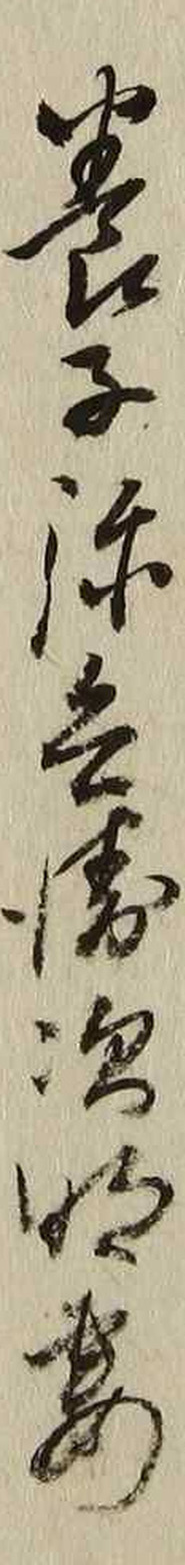女養子弥兵衛次明妻
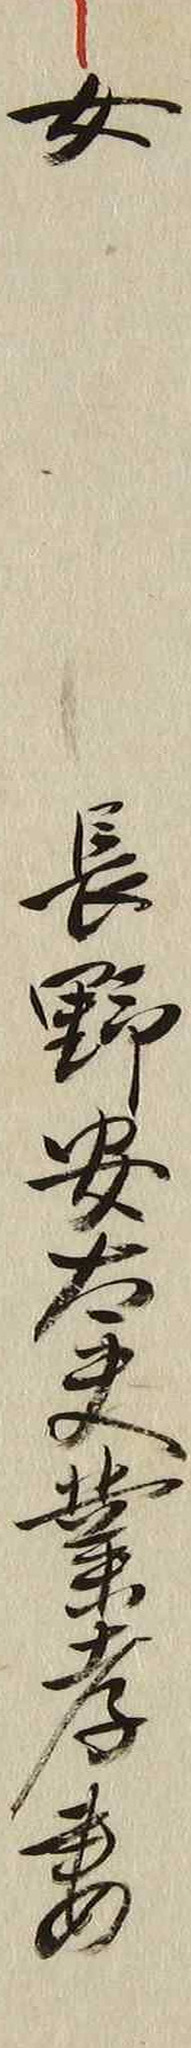女長野安太夫業孝妻
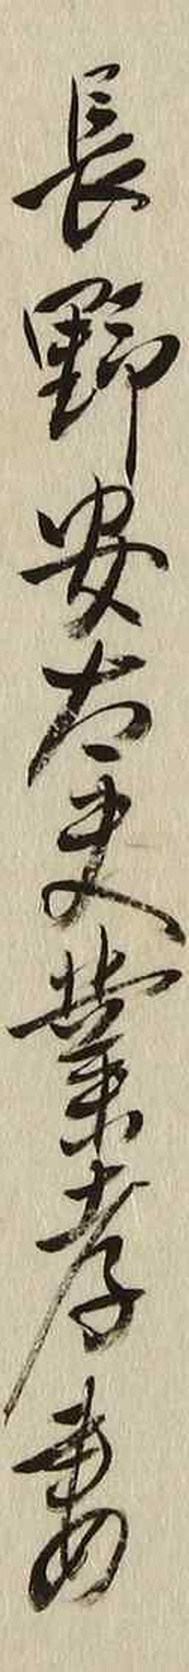女長野安太夫業孝妻
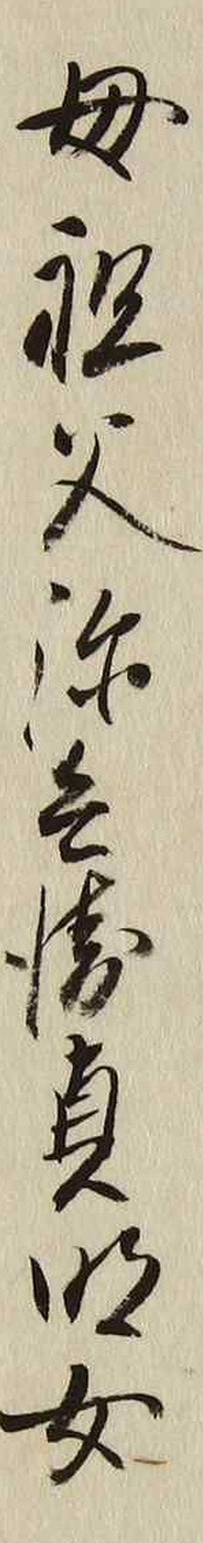母祖父弥兵衛貞明女
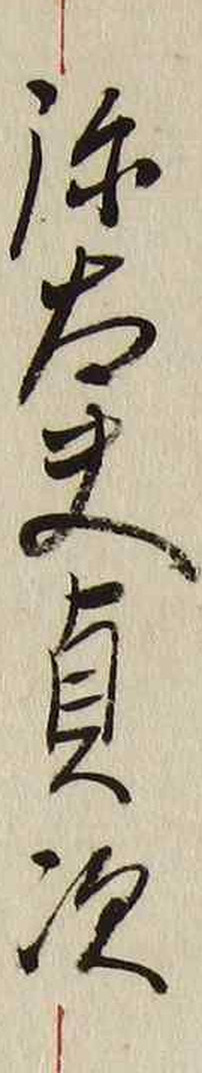弥太夫貞次
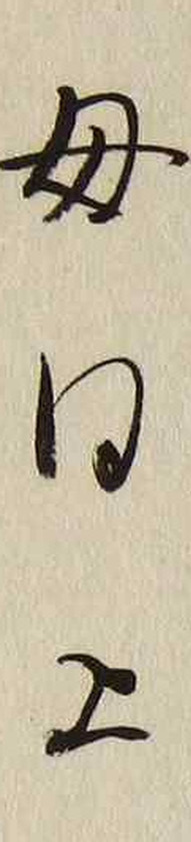母同上
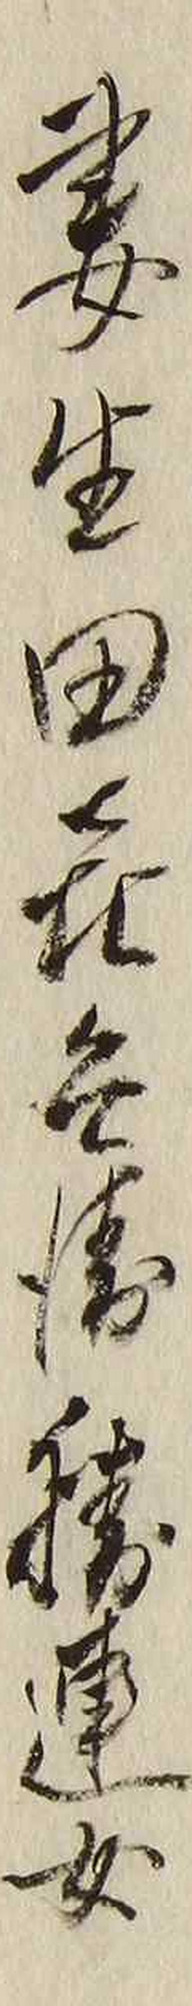妻生田喜兵衛勝連女

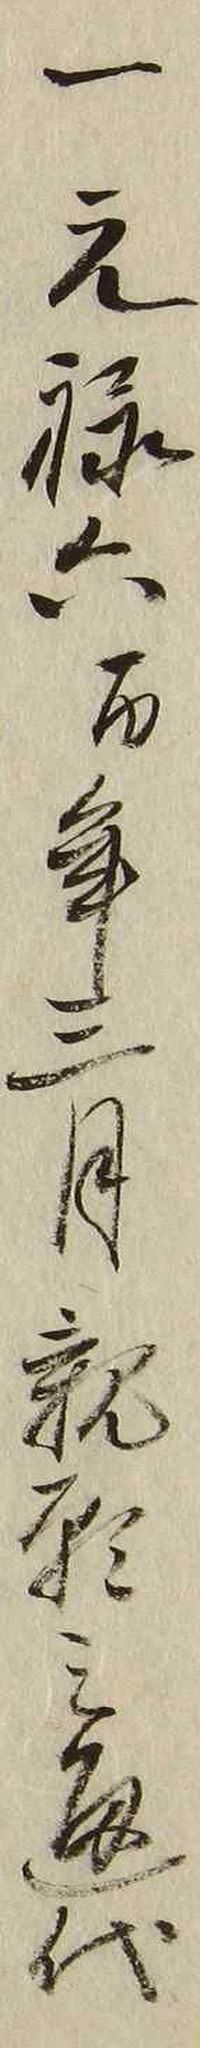一元禄六酉年三月親願之通代
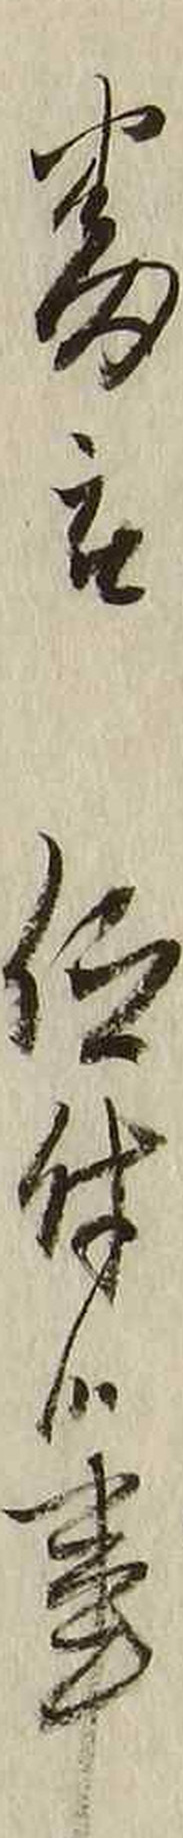番被仰付候事
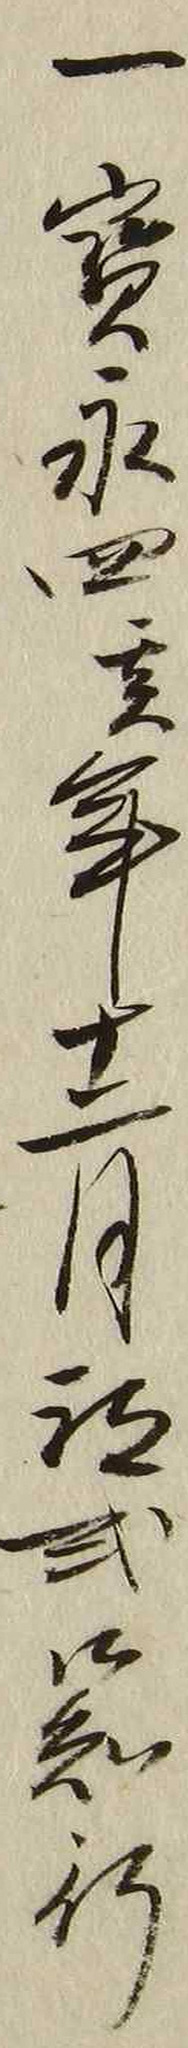一宝永四亥年十二月跡式御知行
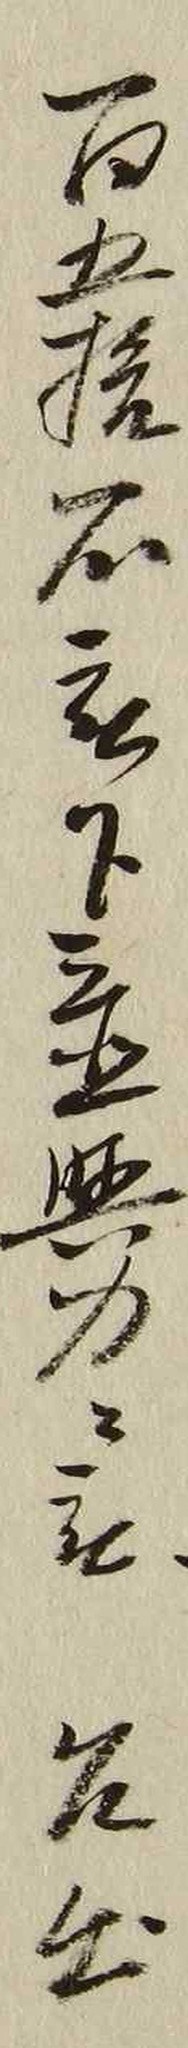百五拾石被下置与力被召出
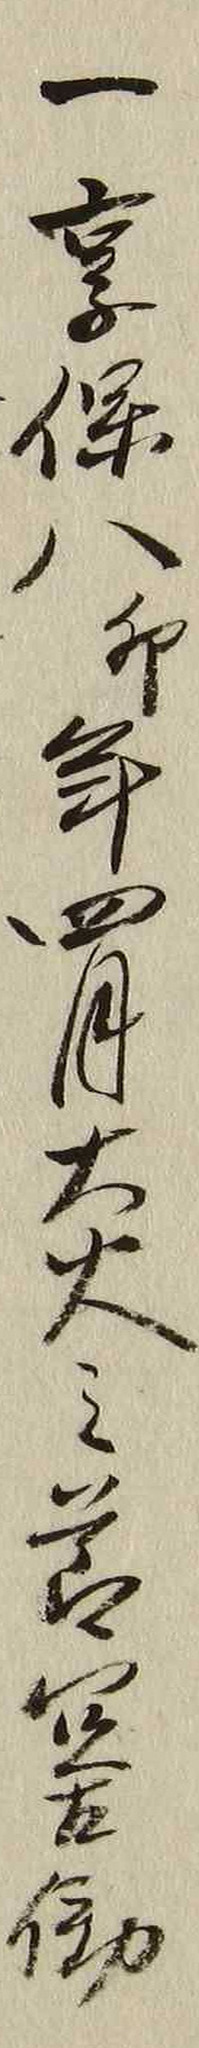一享保八卯年四月大火之節宜相働
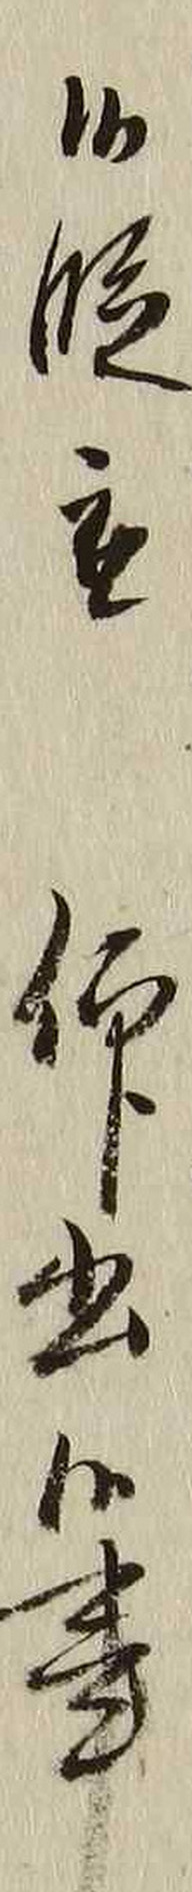候段被仰出候事
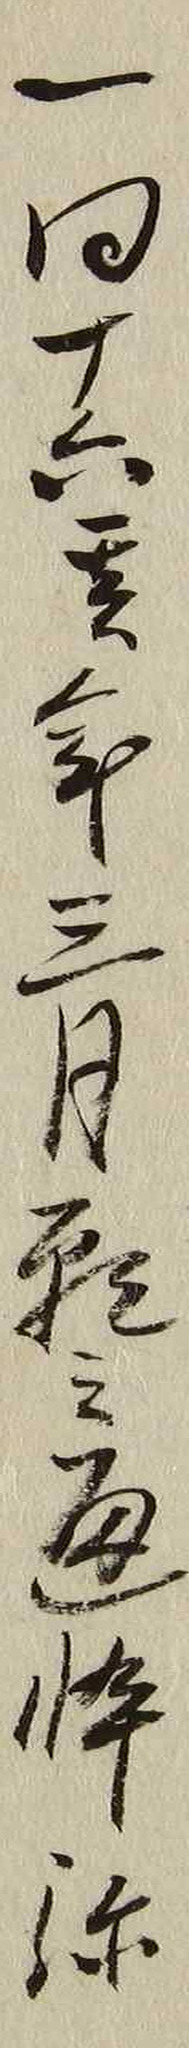一同十六亥年三月願之通忰弥
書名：諸士系譜　巻之350　せ之部1冊全
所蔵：会津若松市立会津図書館
